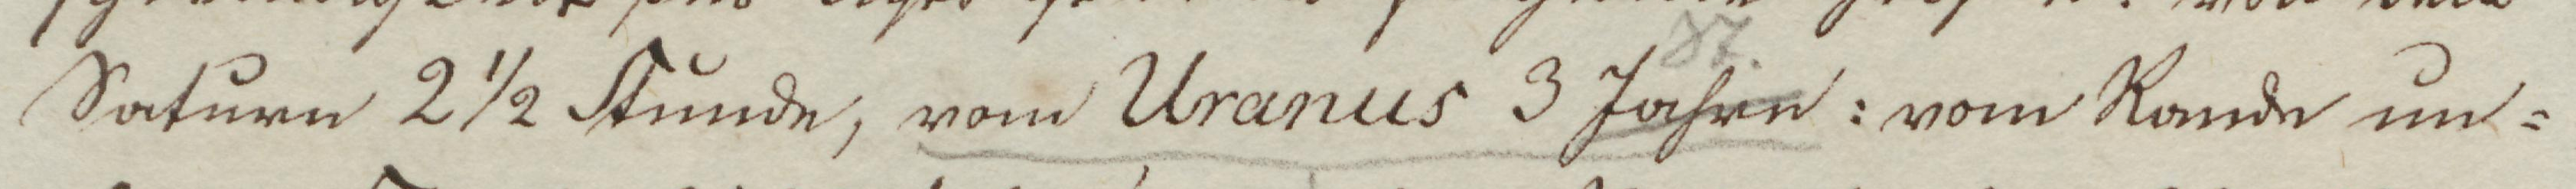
Saturn 2½ Stunde, vom Uranus 3 JahreSt.: vom Rande un-
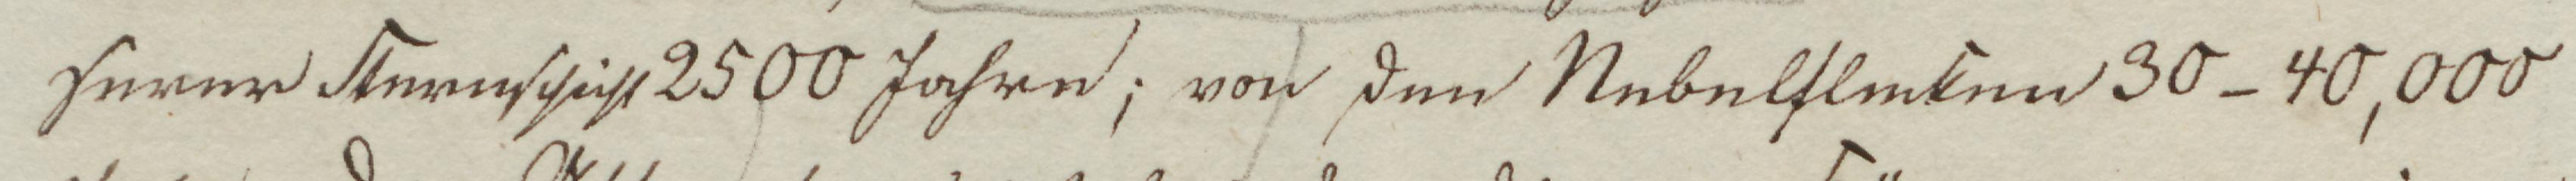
serer Sternschicht 2500 Jahre; von den Nebelflecken 30–40,000
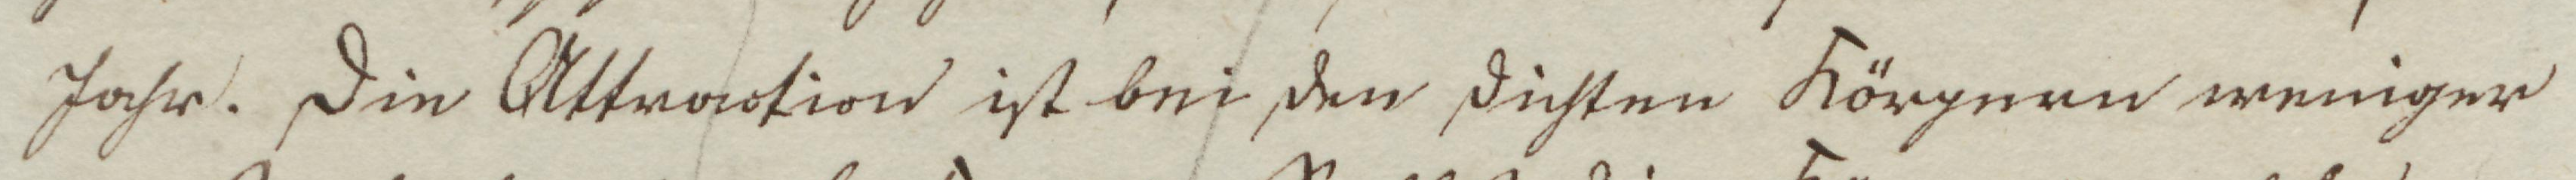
Jahr. Die Attraction ist bei den dichten Körpern weniger
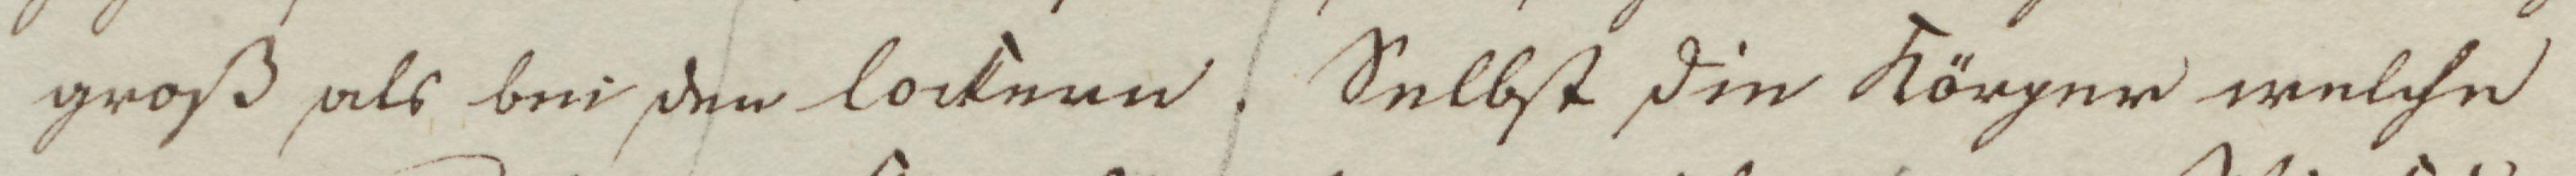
groß als bei den lockern. Selbst die Körper welche
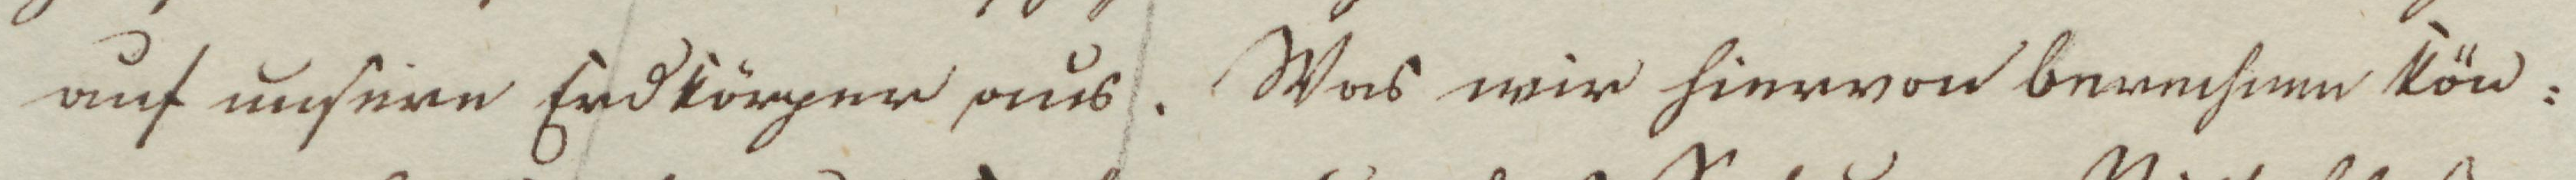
auf unsern Erdkörper aus. Was wir hiervon berechnen kön-
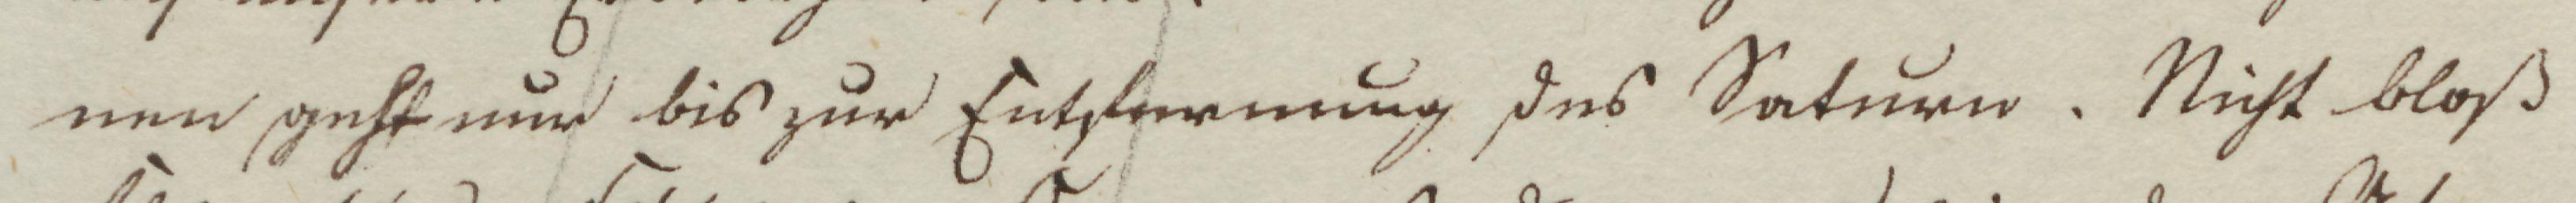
nen geht nur bis zur Entfernung des Saturn. Nicht bloß
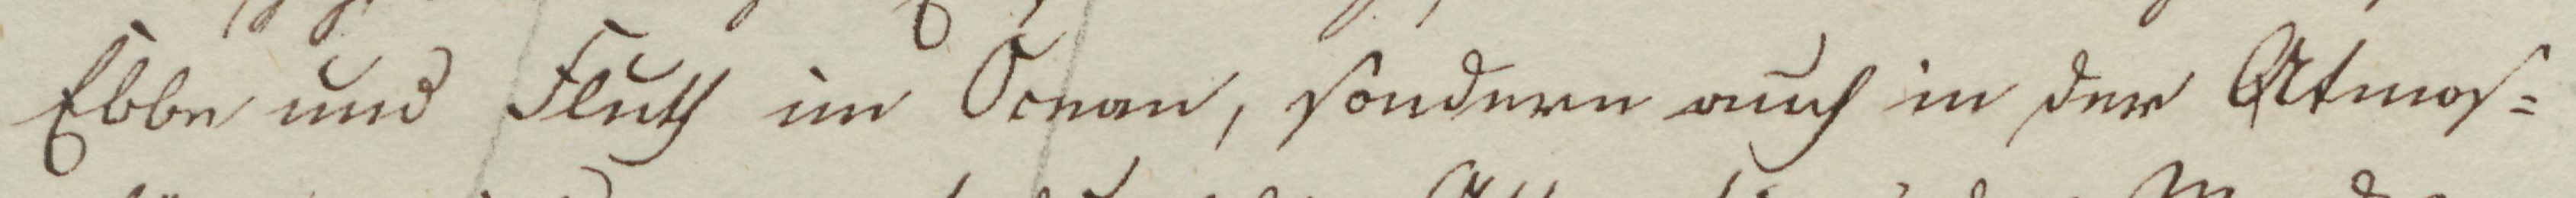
Ebbe und Fluth im Ocean, sondern auch in der Atmos-
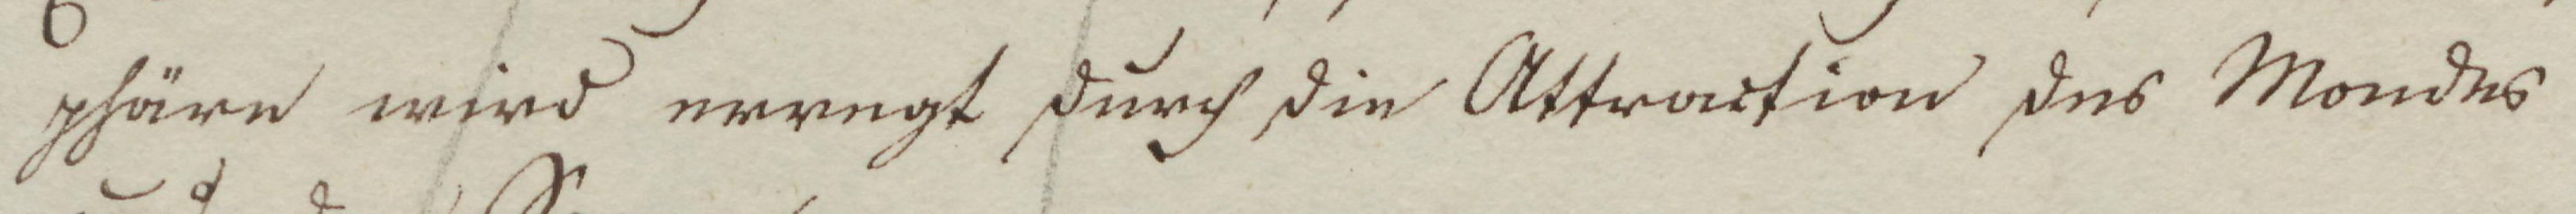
phäre wird erregt durch die Attraction des Mondes
